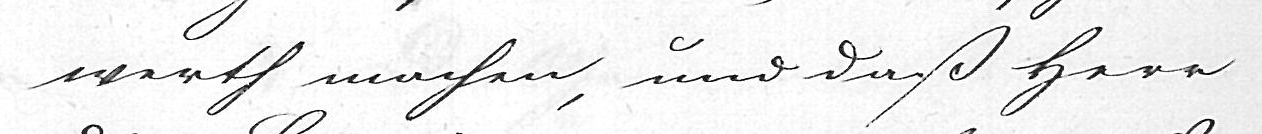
werth machen, und daß Herr
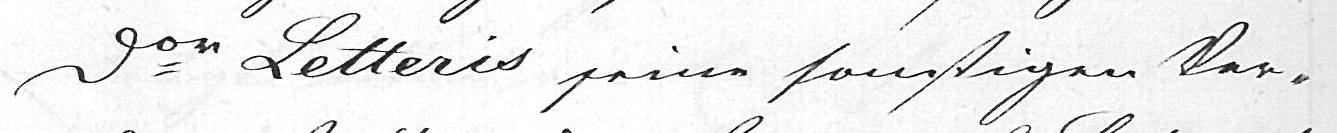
Dor Letteris seine sonnstigen Ver-
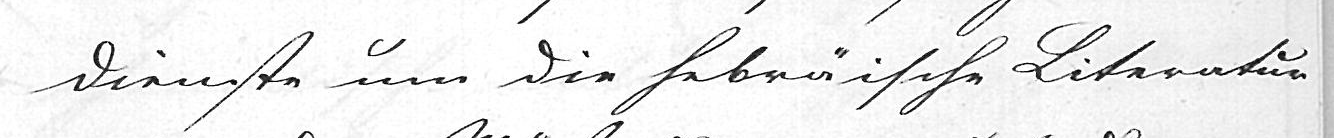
dienste um die hebräische Literatur
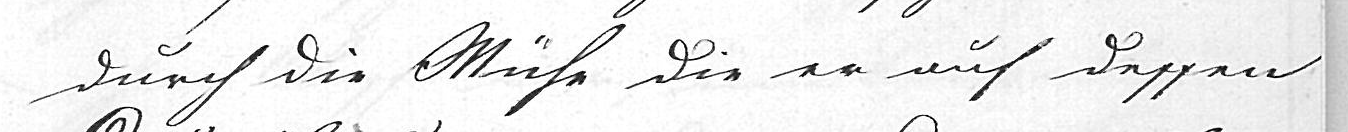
durch die Mühe die er auf dessen
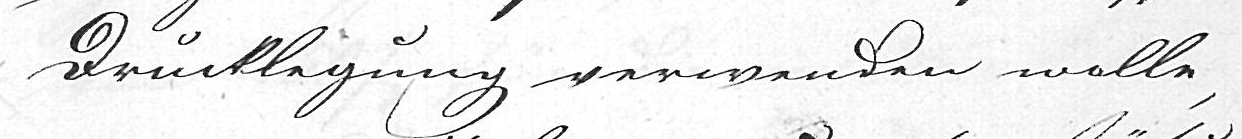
Drucklegung verwenden wolle,
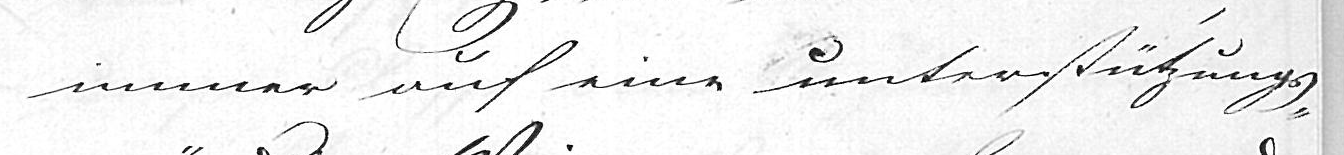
immer auf eine unterstützungs-
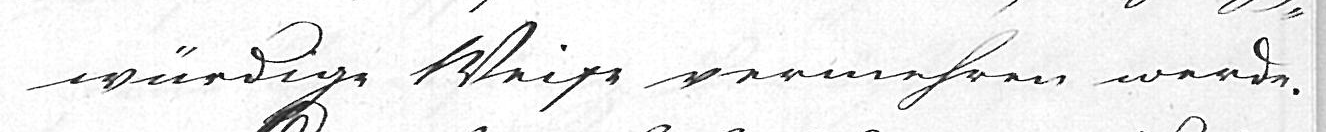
würdige Weise vermehren werde.
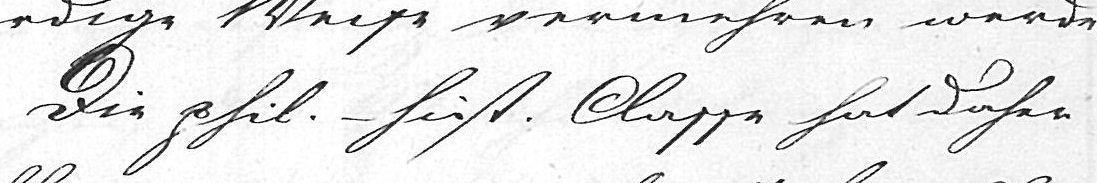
Die phil.-hist. Classe hat daher
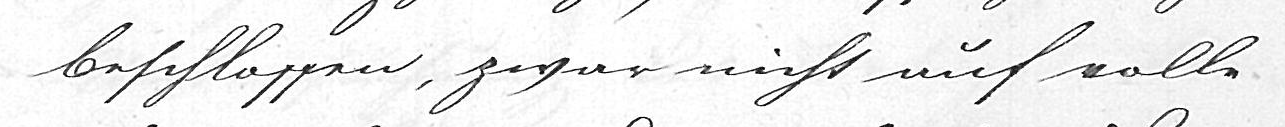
beschlossen, zwar nicht auf volle
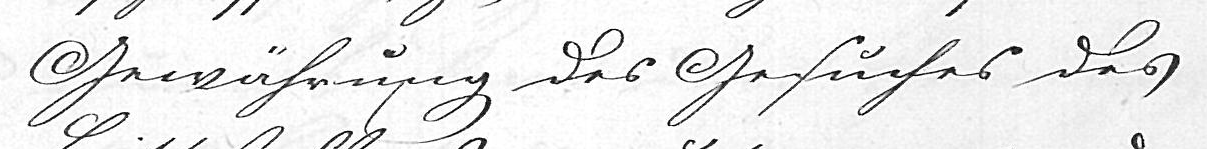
Gewährung des Gesuches des
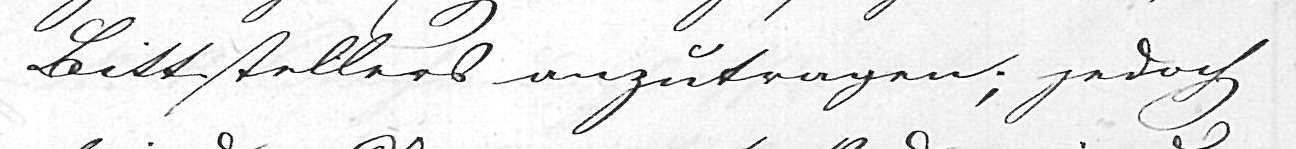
Bittstellers anzutragen; jedoch
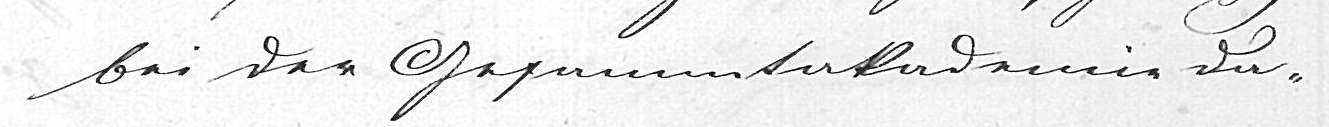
bei der Gesammtakademie da-
